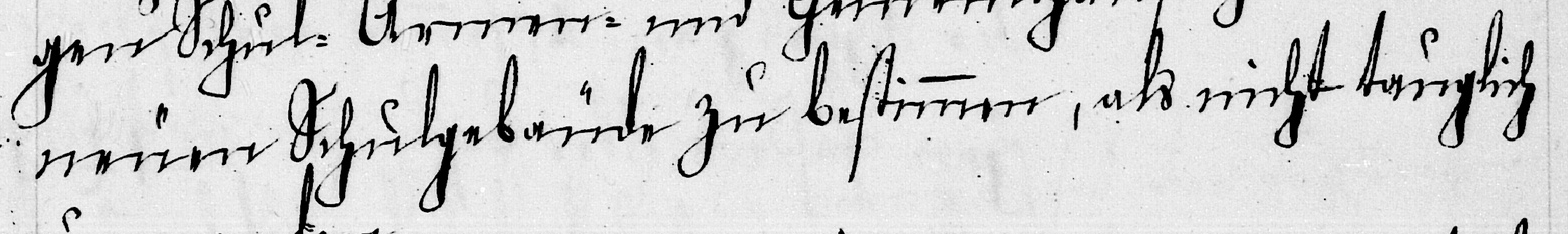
neuen Schulgebäude zu bestimmen, als nicht tauglich
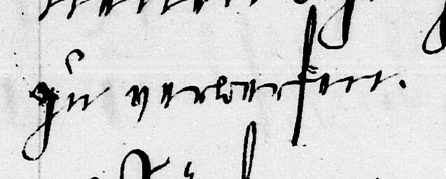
zu verwerfen.
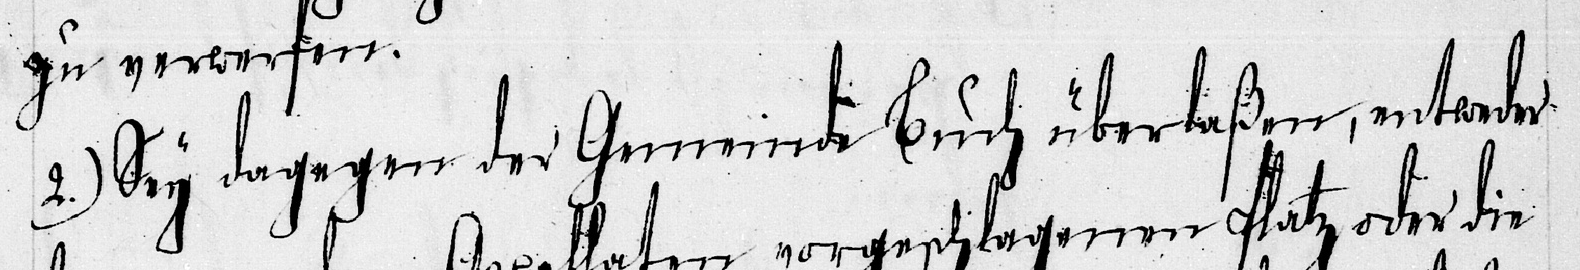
2.) Sey dagegen der Gemeinde Buch überlaßen, entweder
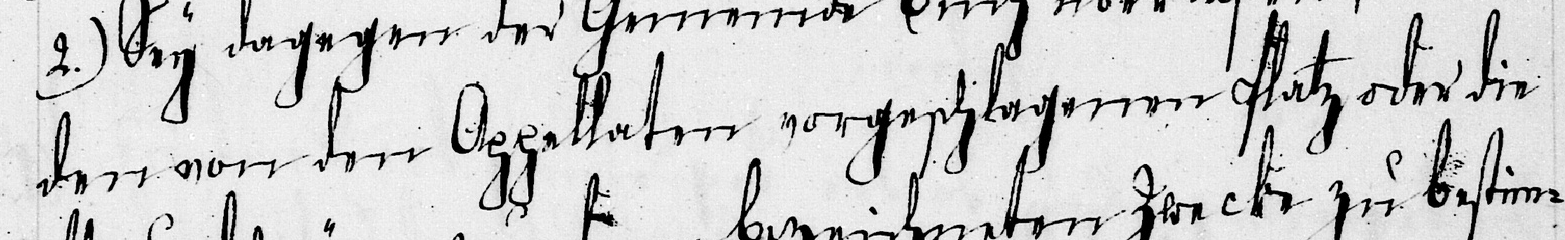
den von den Appellaten vorgeschlagenen Platz oder die
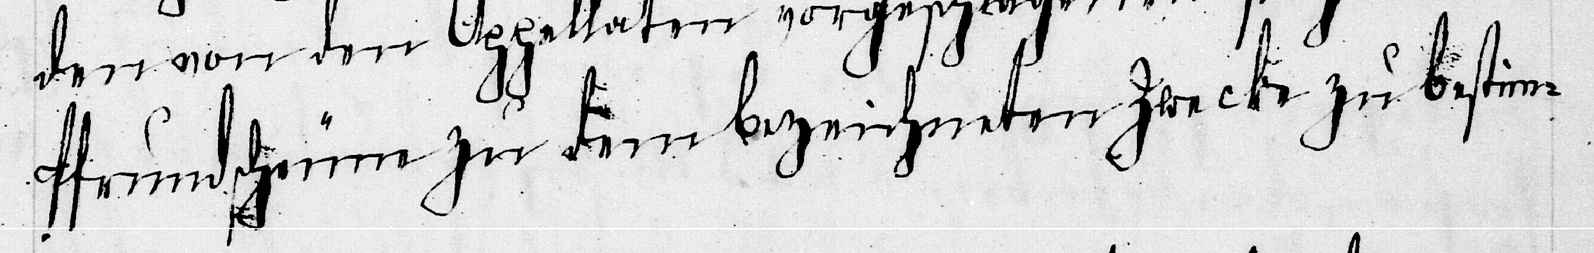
Pfrundscheune zu dem bezeichneten Zwecke zu bestimm¬
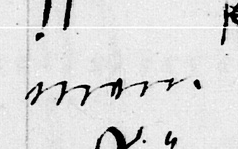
en.
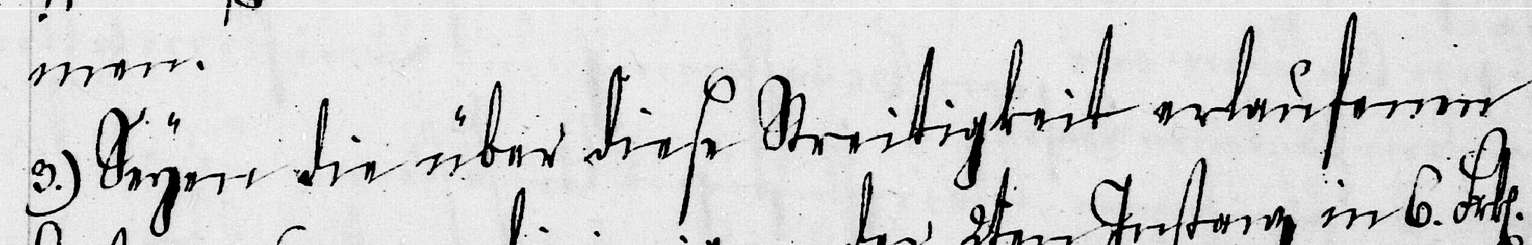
3.) Seyen die über diese Streitigkeit erlaufenen
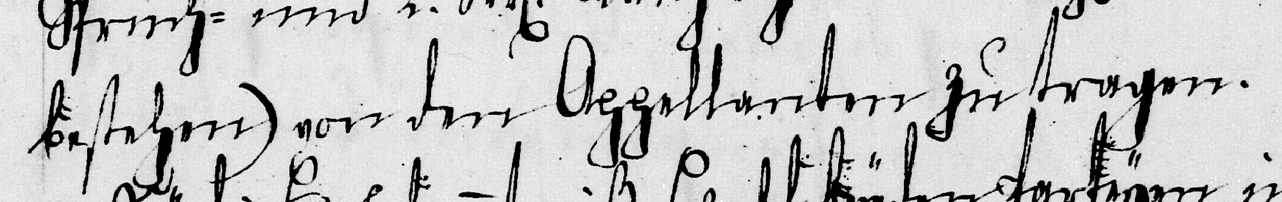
bestehen) von den Appellanten zu tragen.
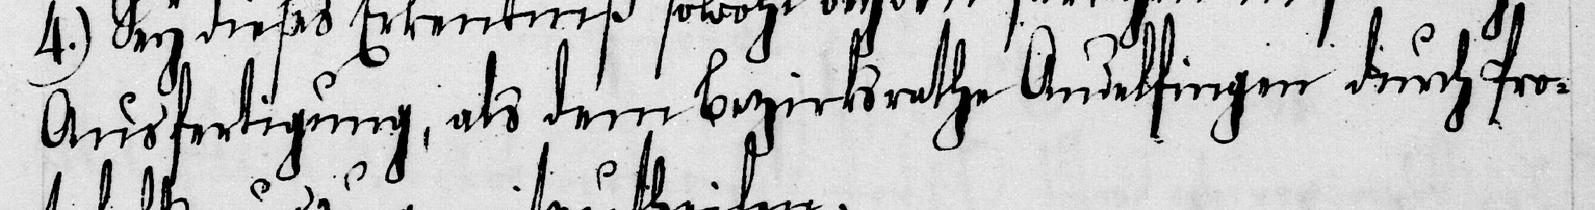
Ausfertigung, als dem Bezirksrathe Andelfingen durch Pro¬
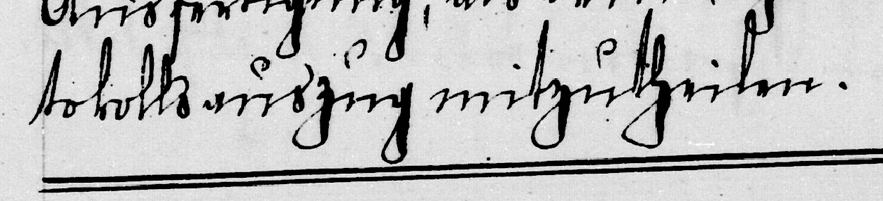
tokollsauszug mitzutheilen.
